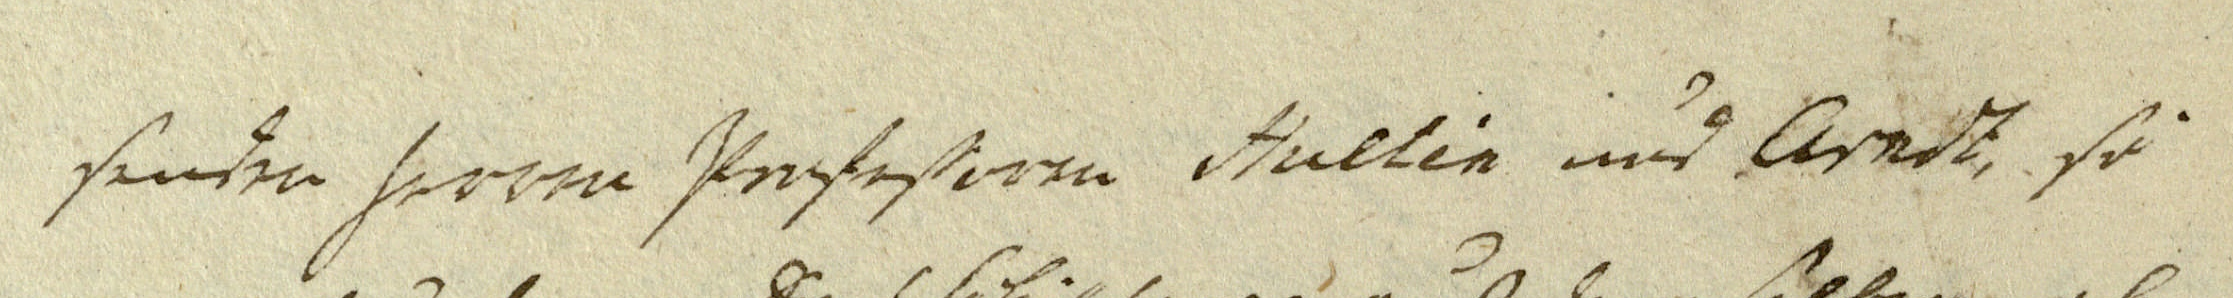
senden Herren Professoren Hultén und Arndt, so
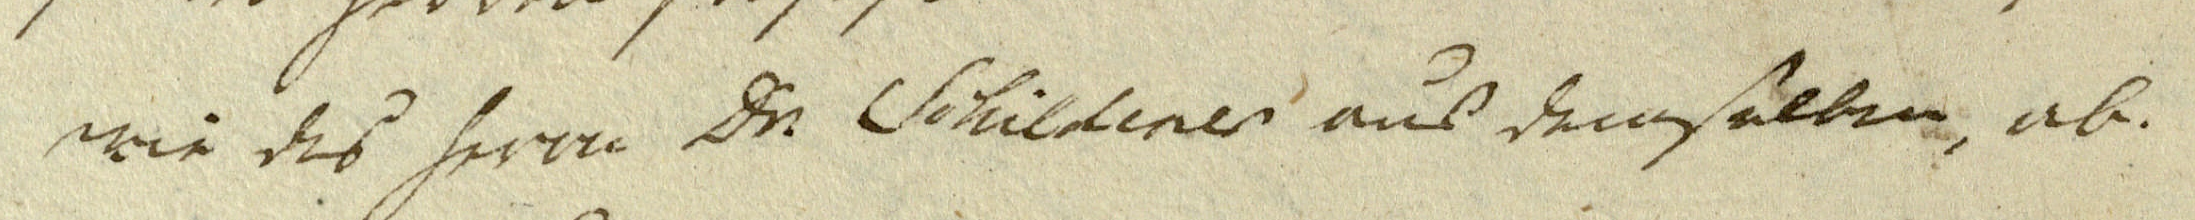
wie des Herrn Dr. Schildener aus demselben, ab¬
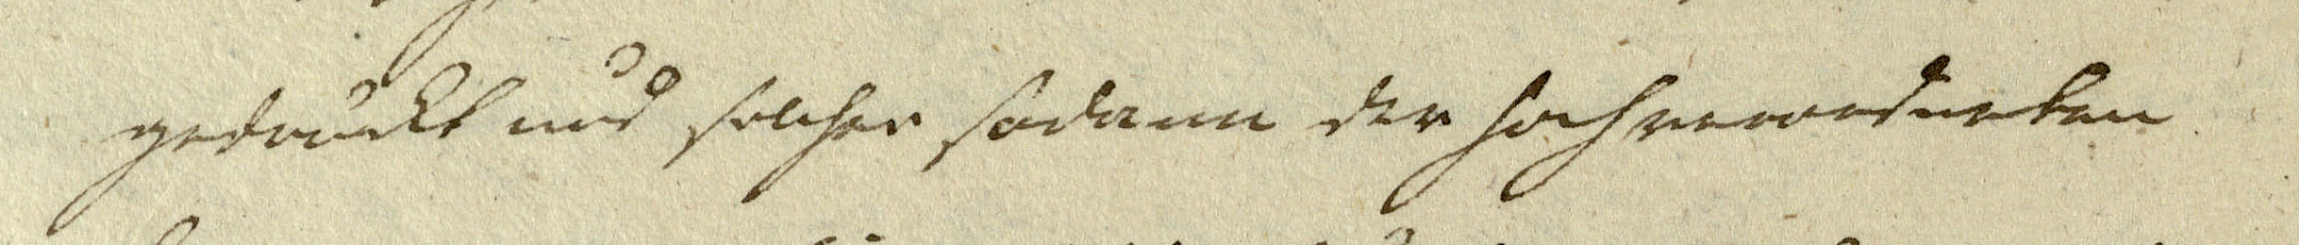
gedruckt und solcher sodann der hochverordneten
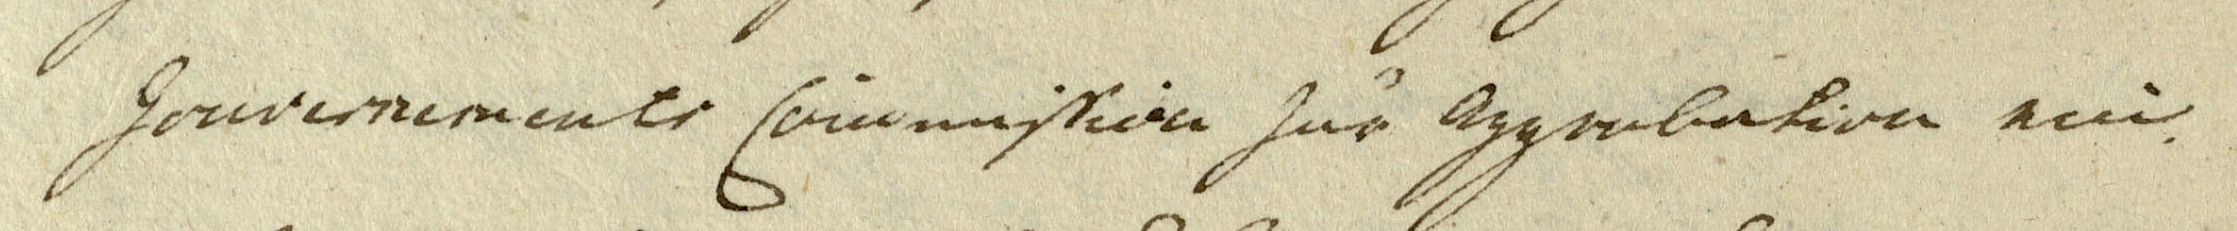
Gouvernements Commission zur Approbation ein¬
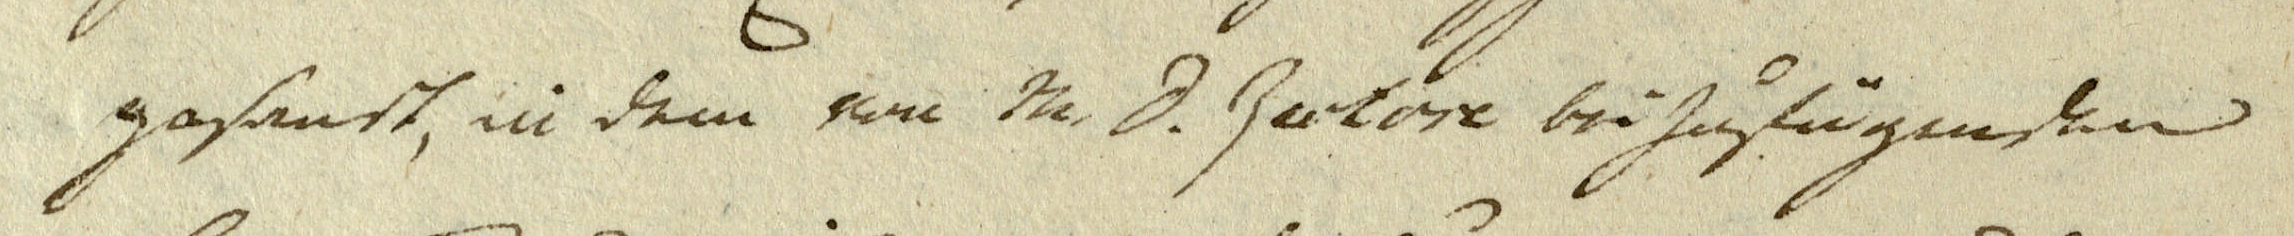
gesandt, in dem von M. D. Rectore beizufügenden
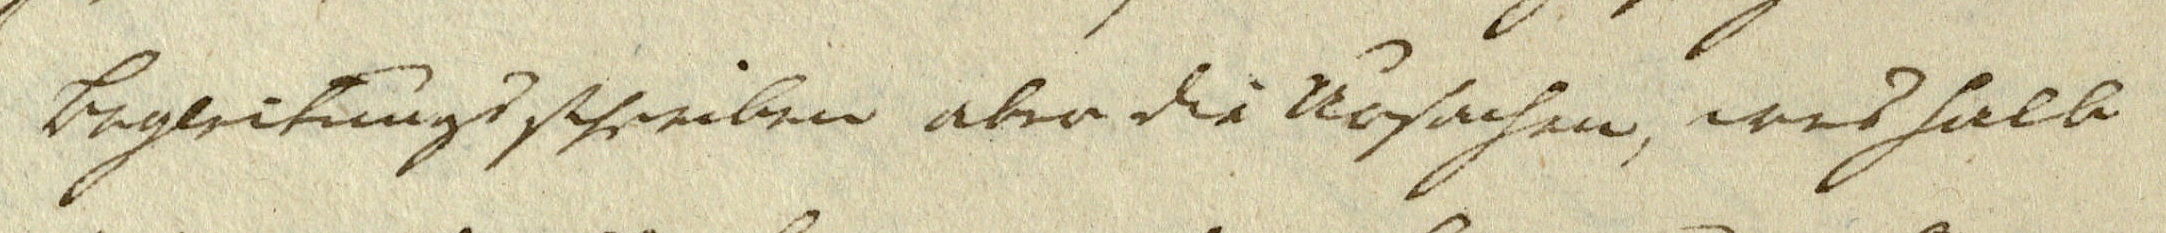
Begleitungsschreiben aber die Ursachen, weshalb
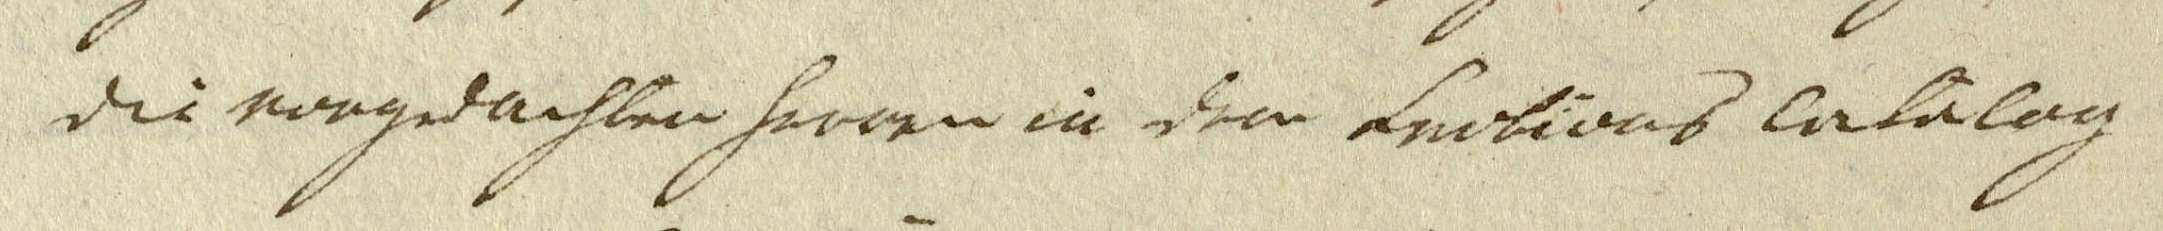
die vorgedachten Herren in dem Lections Catalog
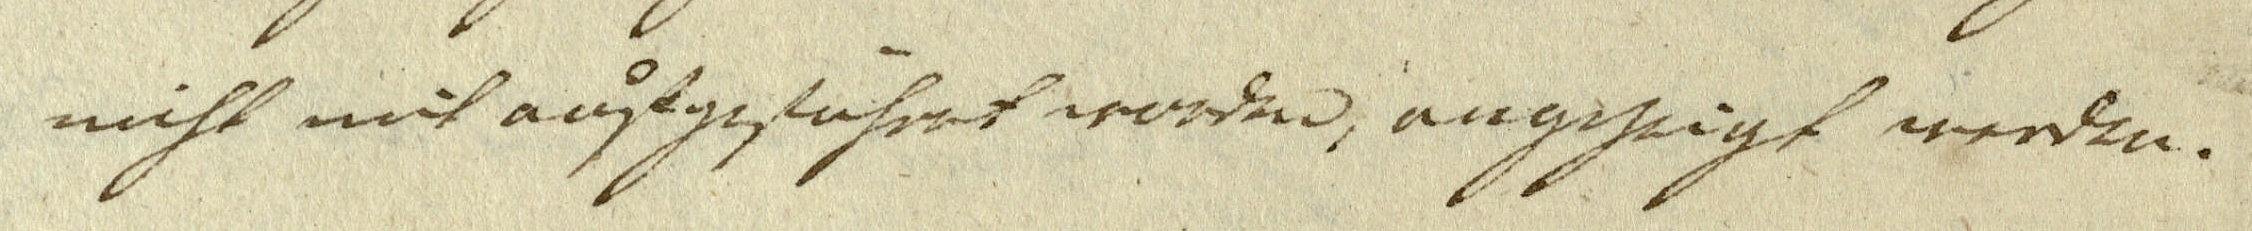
nicht mit aufgeführet worden, angezeigt werden.
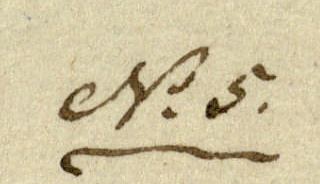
No 5.
